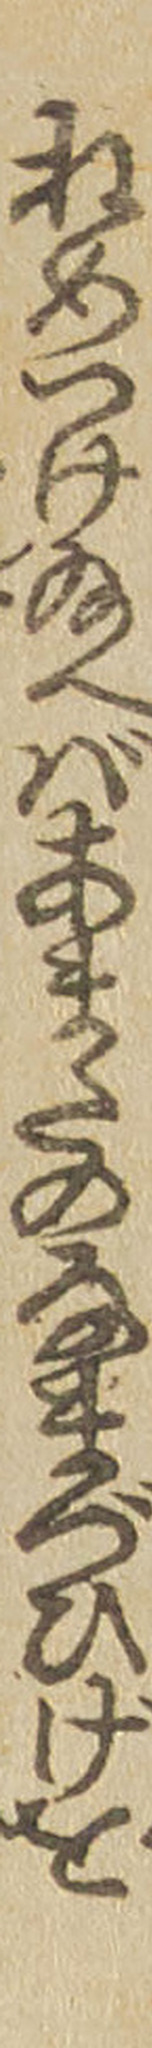ねめつけゐへばあまたのなまづひげを
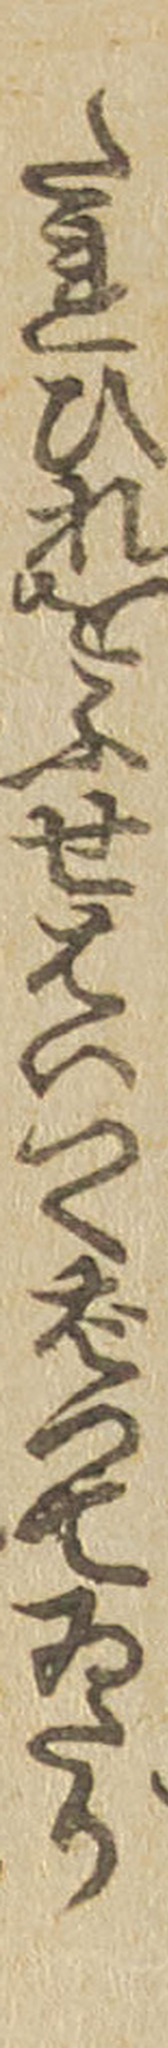たれひれをふせはいつくばつてゐたり
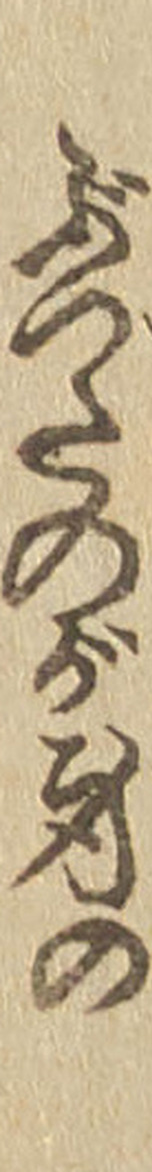ぶつたのが身の
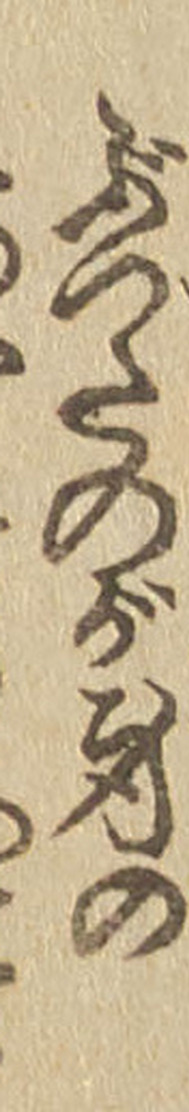ぶつたのが身の
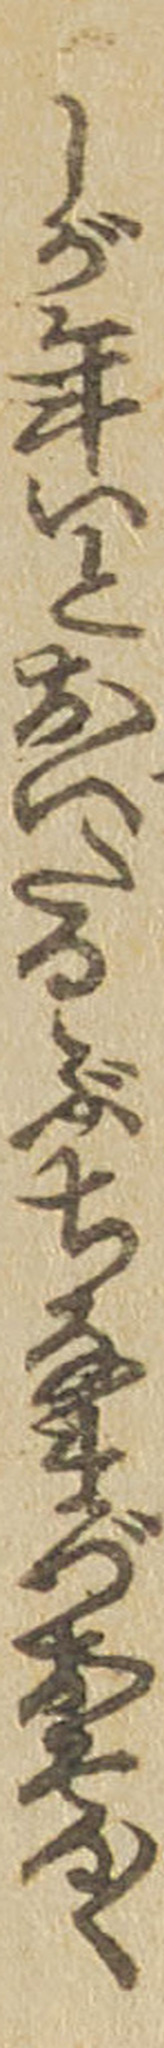しが年いとおいたるぶちなまづおそる〳〵
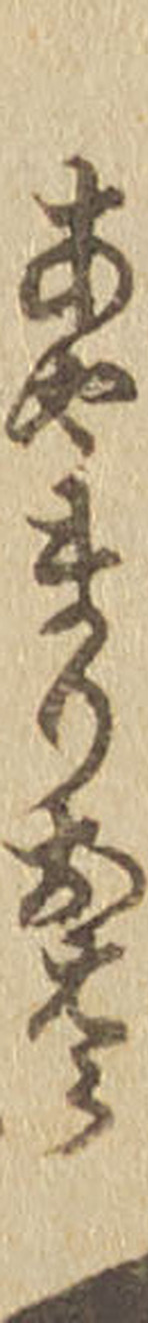あやまりおはら
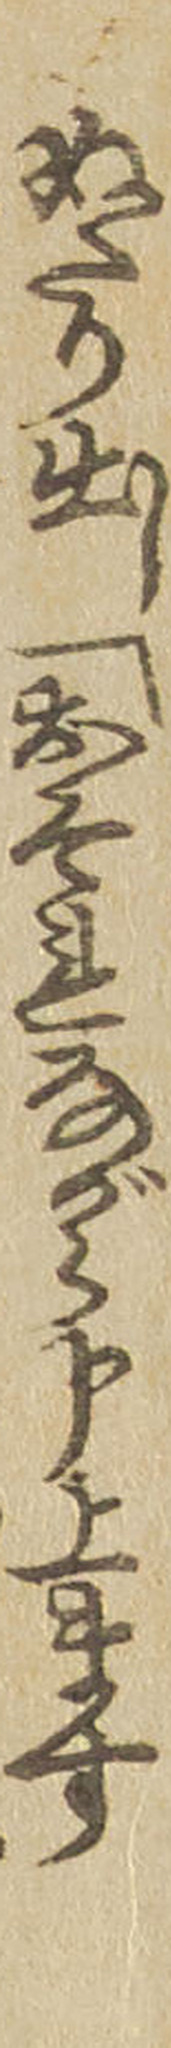ぬたり出し｢おそれながら申上ます
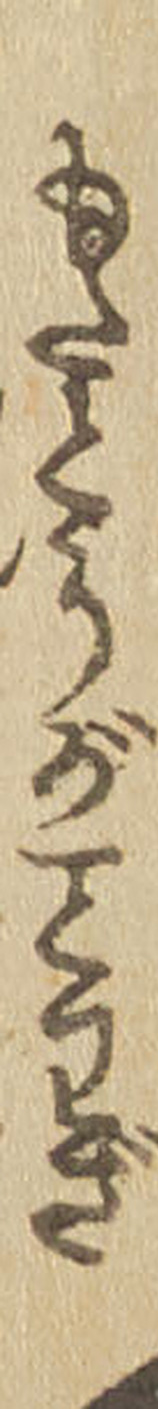もたとうがことわざ
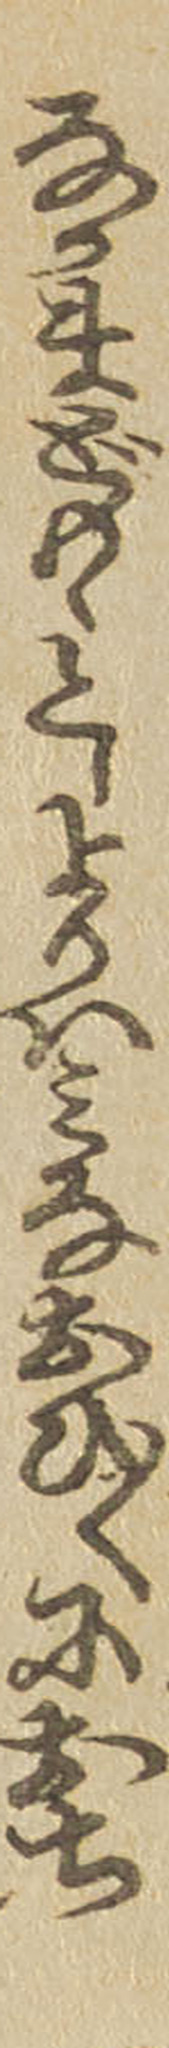なかまどもゝとしよりはみなおひ〳〵におち
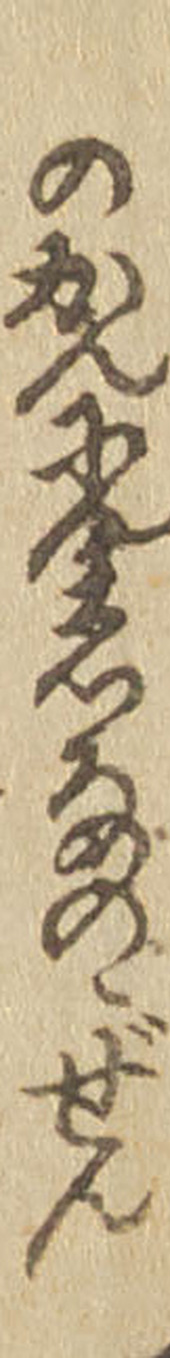のかんにんしなのゝぜん
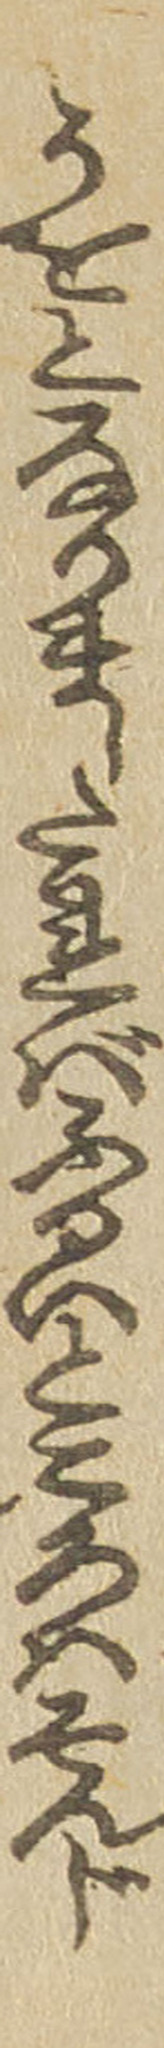うをとなりましたればふるいところはそんじ
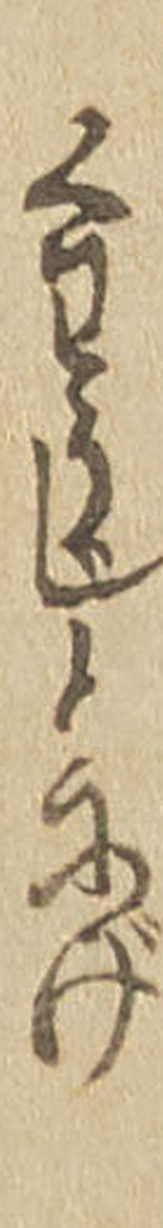くわうじとにげ
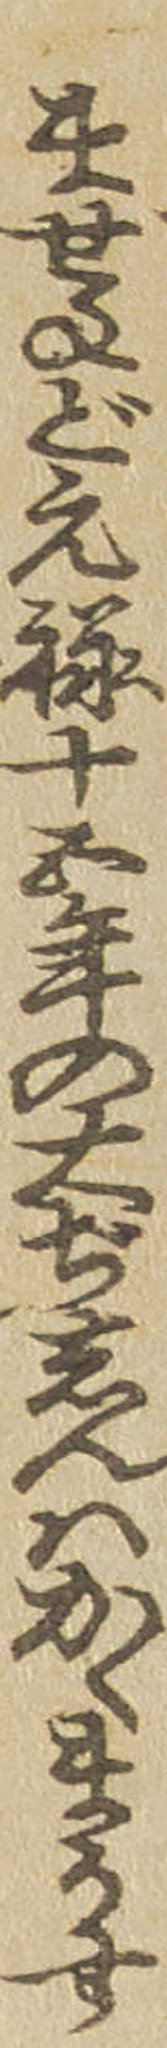ませねど元禄十五年の大ぢしんはかくまうす
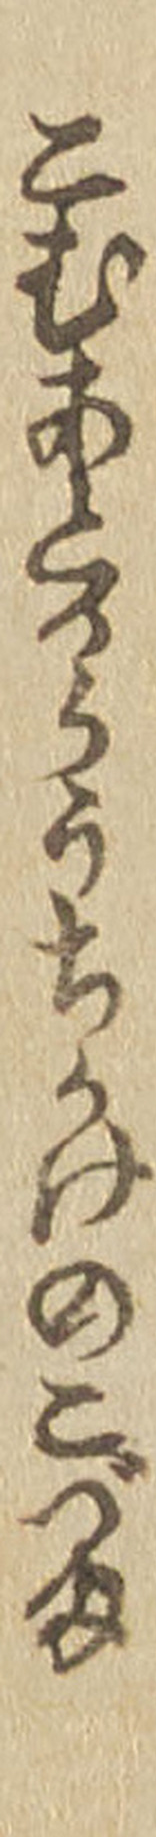こむあとからうちかけのこづま
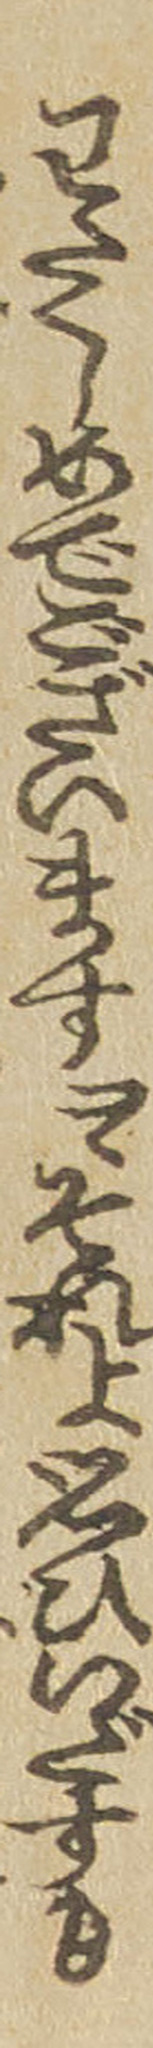わたくしめでございますヲゝそれよ思ひだすも
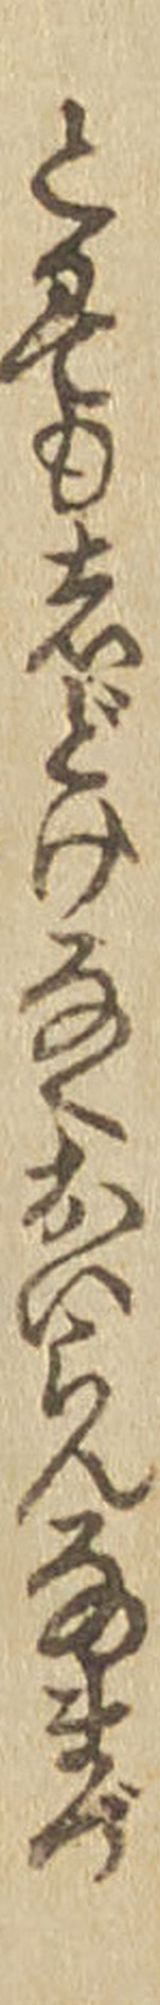とるてもしどけなくおいらんなまづ
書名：地震太平記
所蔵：東京大学総合図書館 General Library in the University of Tokyo, JAPAN
